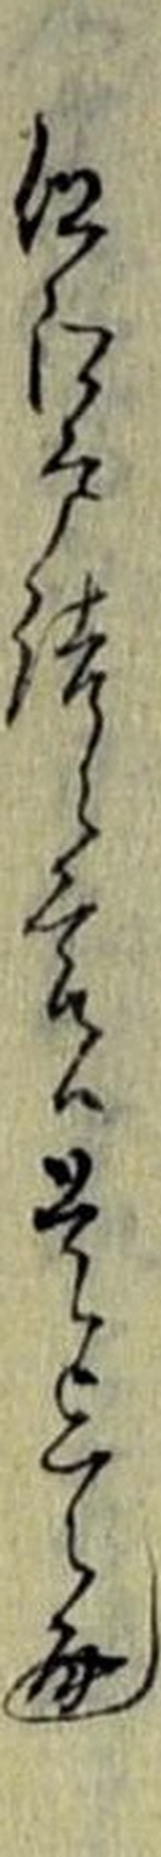但江戸詰之節は是迄之通
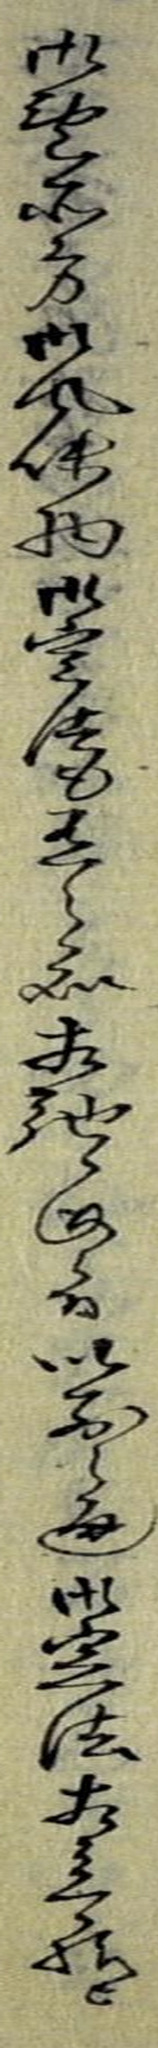一御台所方御風味物御定法も有之候処相弛候趣に付以前之通御定法相立候様被
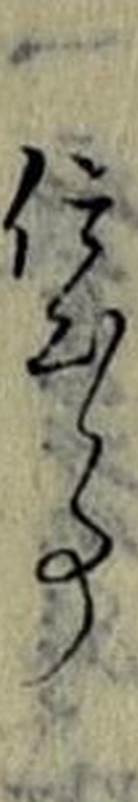仰出候事
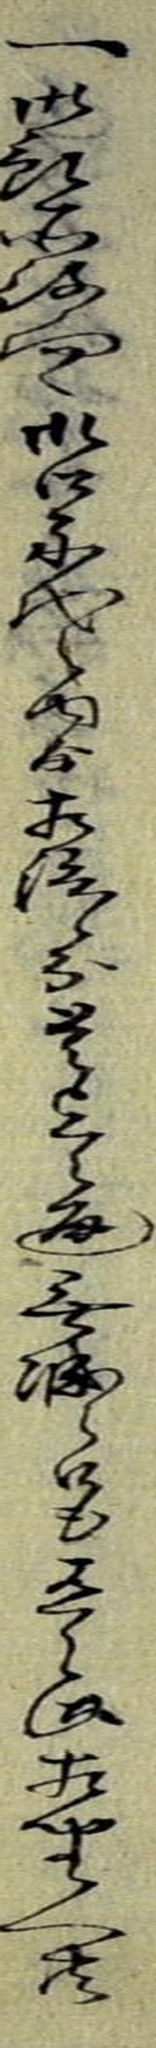一御預所役向へ御口米代之内ゟ相渡候分是迄之通無減之口も有之趣相聞候へ共
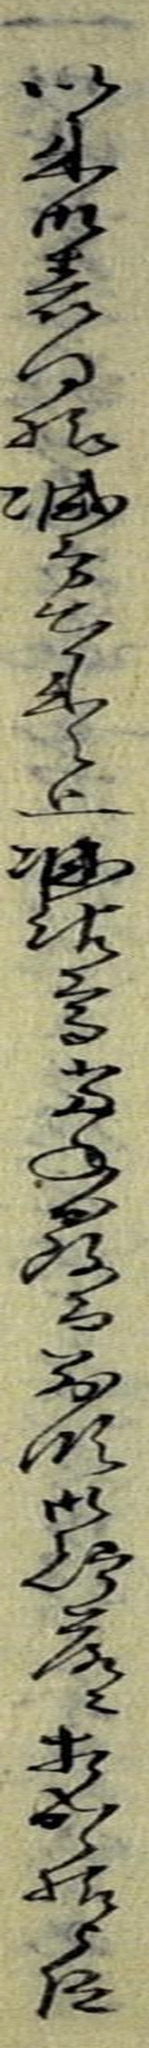以来御表同様減方出来候上減銀高当年ゟ改而別段貯落に相成候様被仰
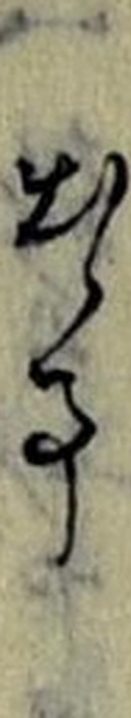出候事
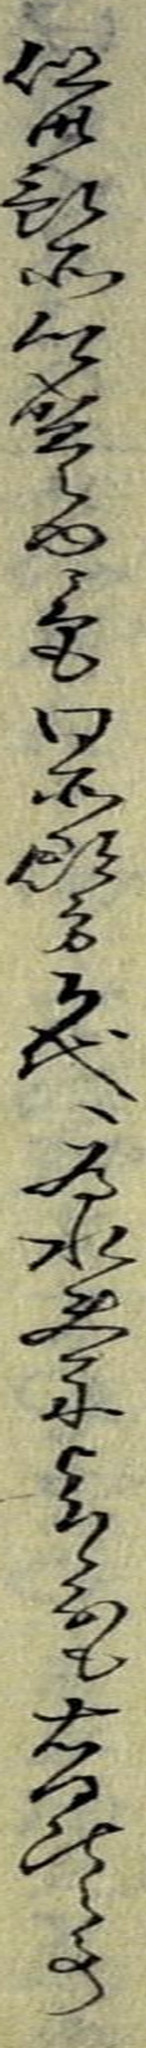但御預所郷盛之内に而も同所郡方下代へ為水夫米被下候分も右同断之事
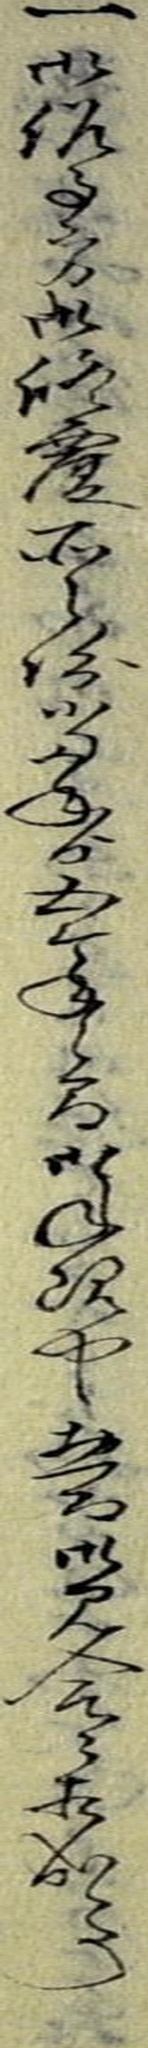作一御作事方御修覆所之儀当年ゟ五ヶ年之間御限中惣而御見合に相成候事
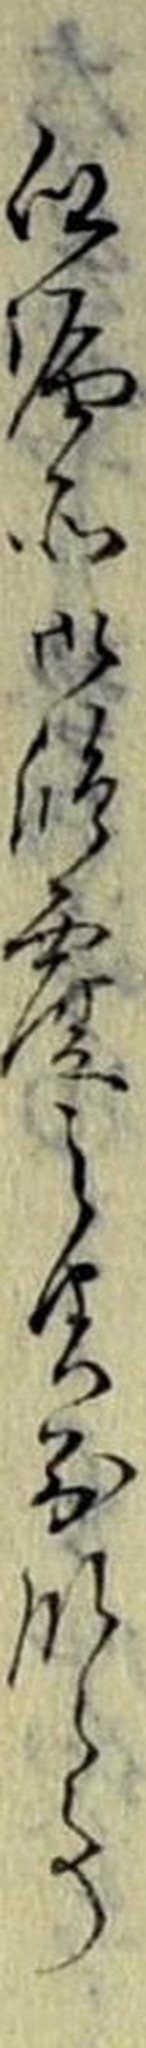但痛所御修覆之儀は別段之事
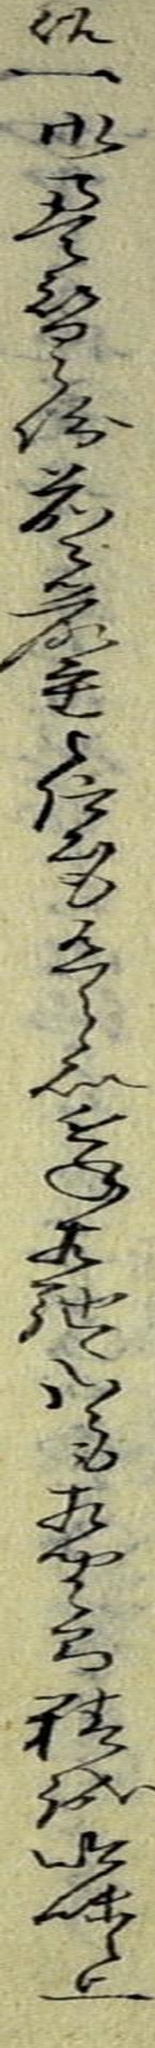作一御畳替之儀前々厳重被仰出も有之候処近年相弛候哉にも相聞候間精誠吟味之上
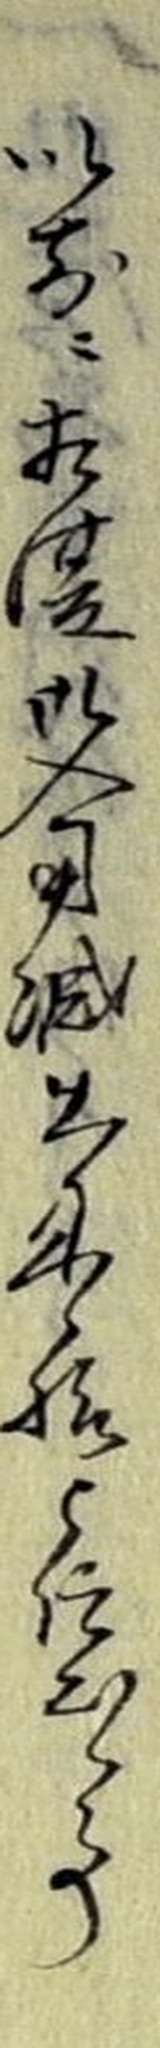以前に相復御入用減出来候様被仰出候事
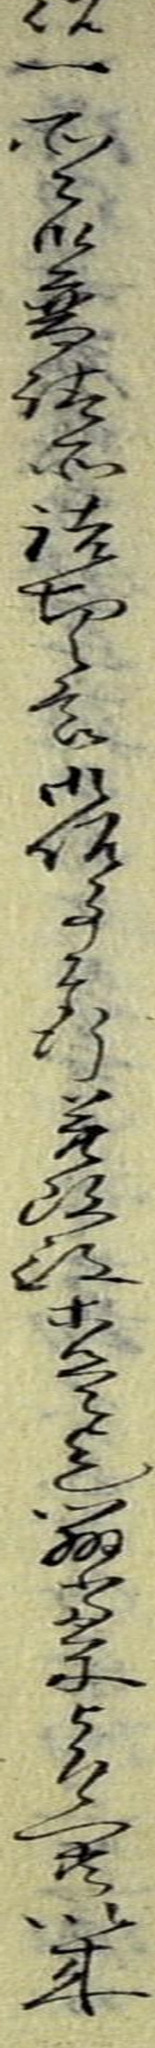作一所々御普請所詰切之節御作事奉行并改役等是迄辨当米被下候へ共以来
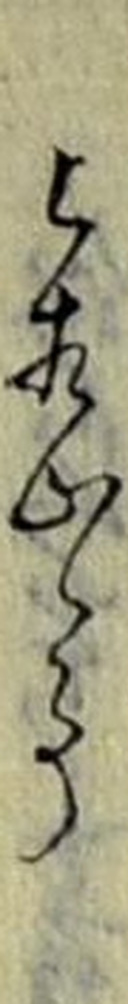被相止候事
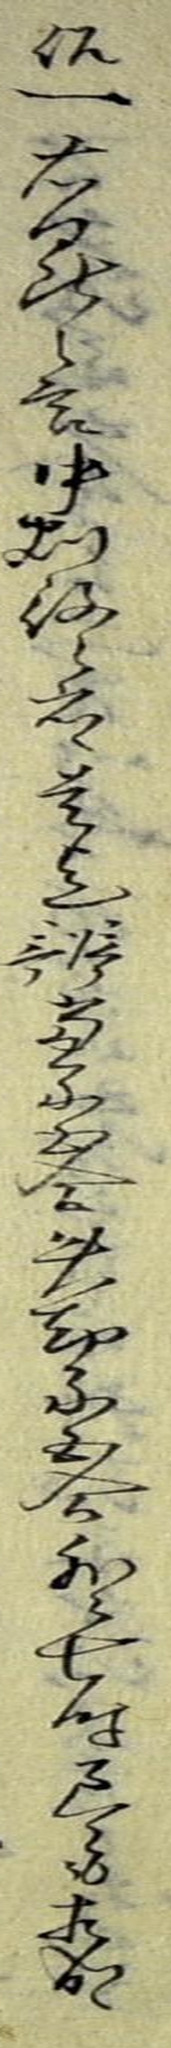作一右同断之節中判役之者へ是迄弁当米五合失却米五合外に七時過にも相成候

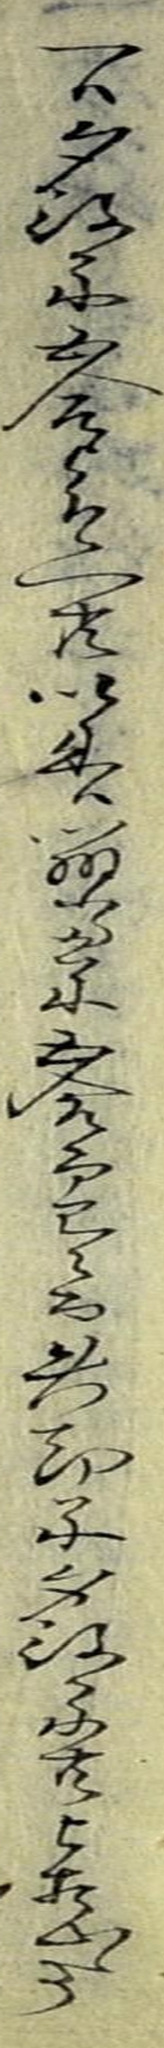へは夕役米五合被下候へ共以来は弁当米五合而己に而失却米夕役米共被相止候事
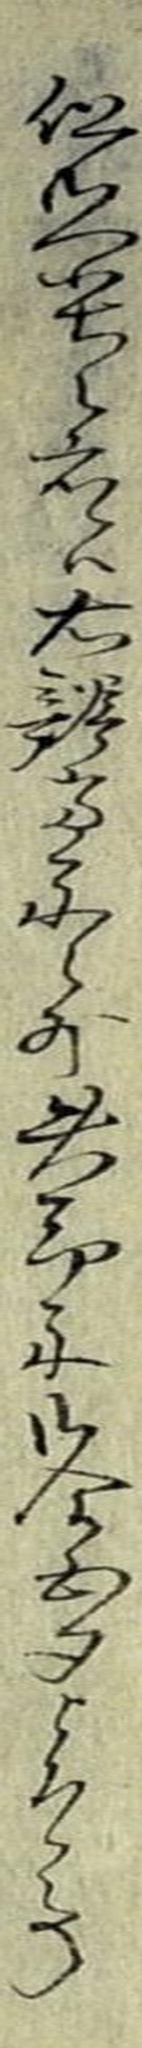但弐人ふち之者は右弁当米之外失却米弐合五夕被下候事
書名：命令之部 六
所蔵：福井県文書館 Fukui Prefectural Archives
